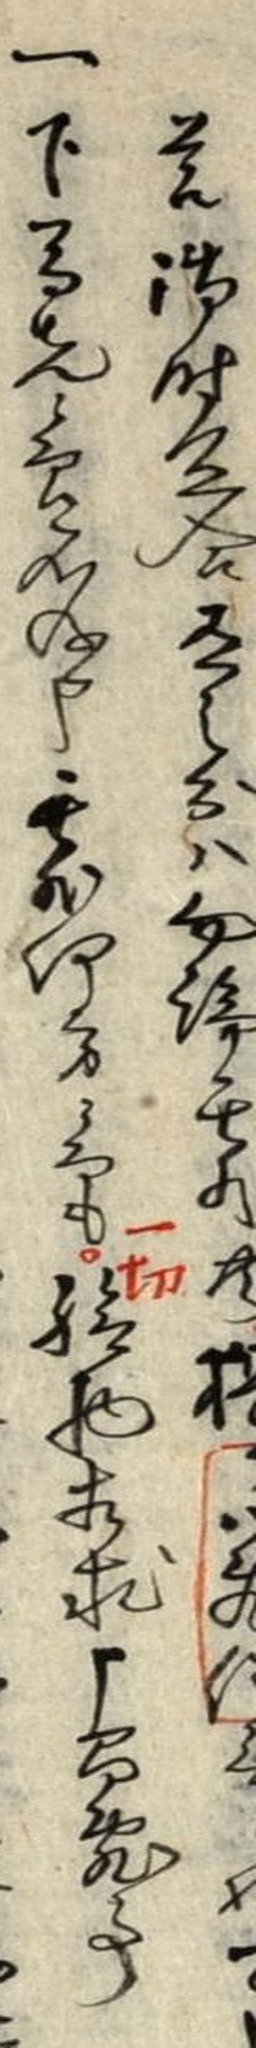一下馬先にては不及申其外何方にても給物相求申間敷事
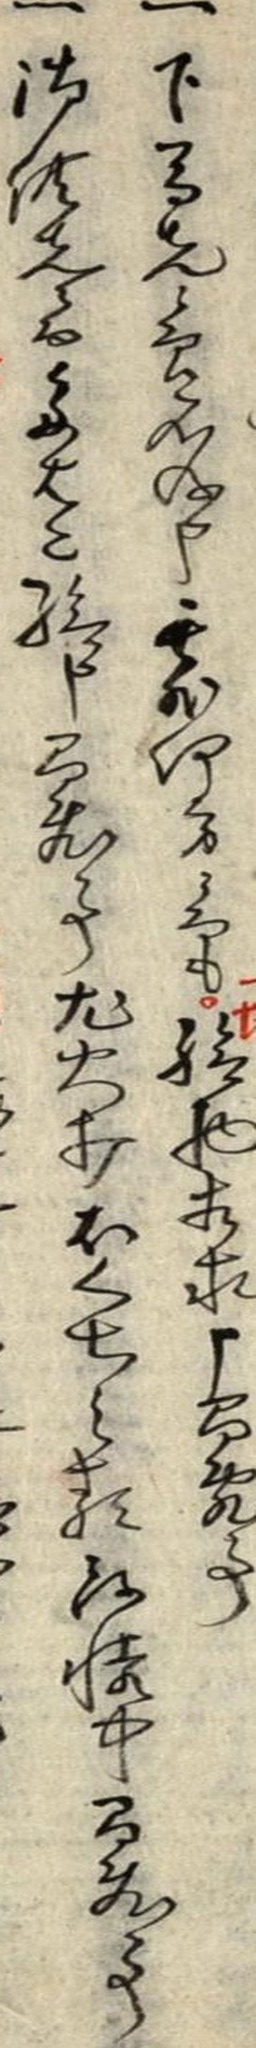一御供先にてたはこ給申間敷事尤火打ほくち之類致懐中間敷事
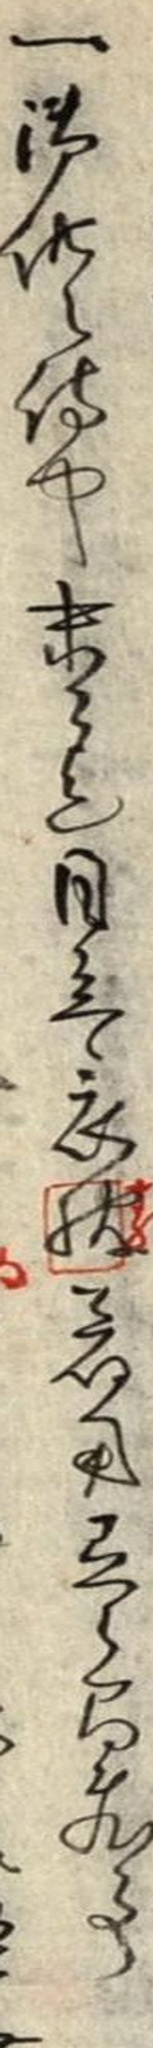一御供之侍中末々迄目立候衣「服」着用有之間敷事
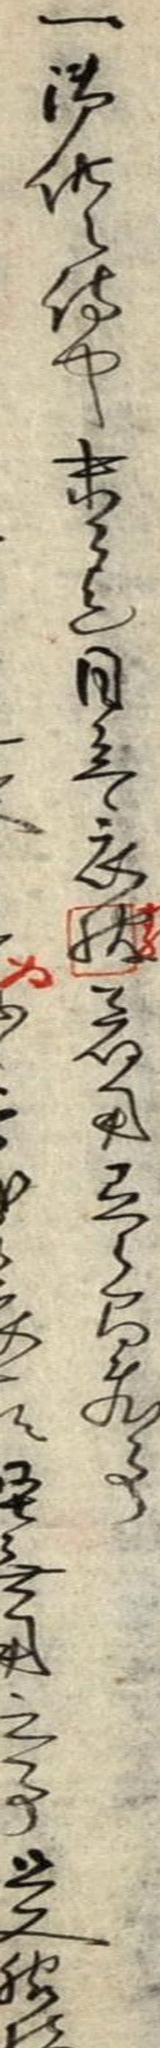一御供之侍中末々迄目立候衣「服」着用有之間敷事
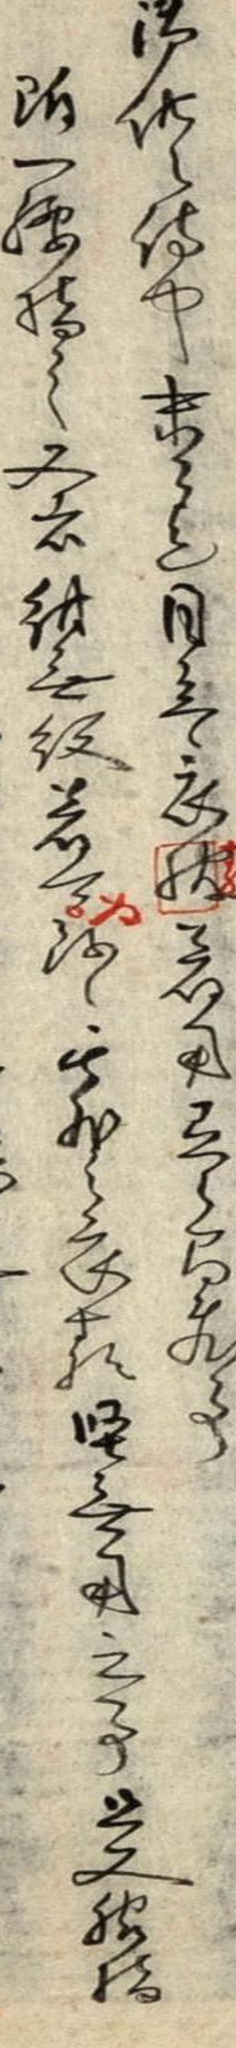附一腰指之又物紺無紋着可致候其外之衣類堅無用之事且又脇指
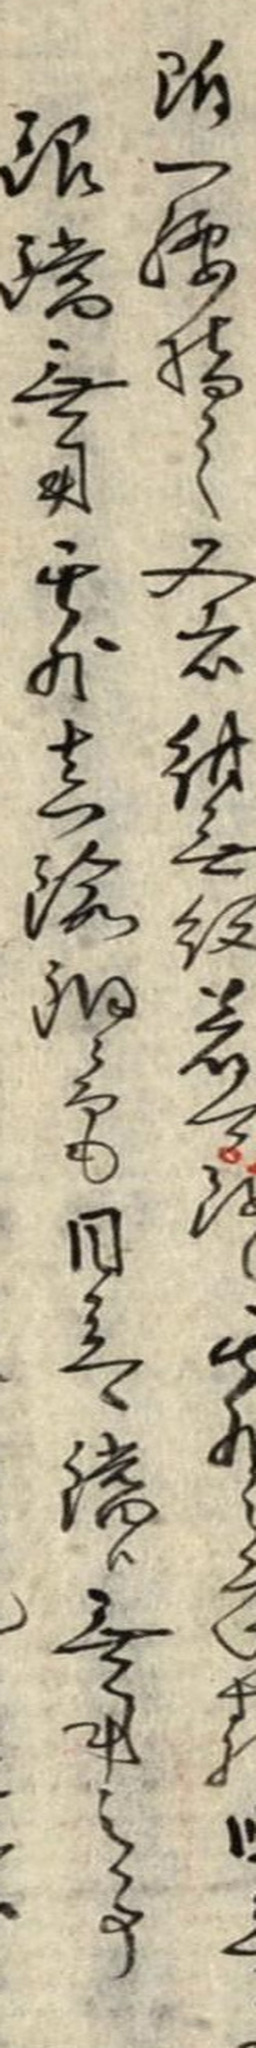銀鐺無用其外真鍮銅にても目立候鐺は無用之事
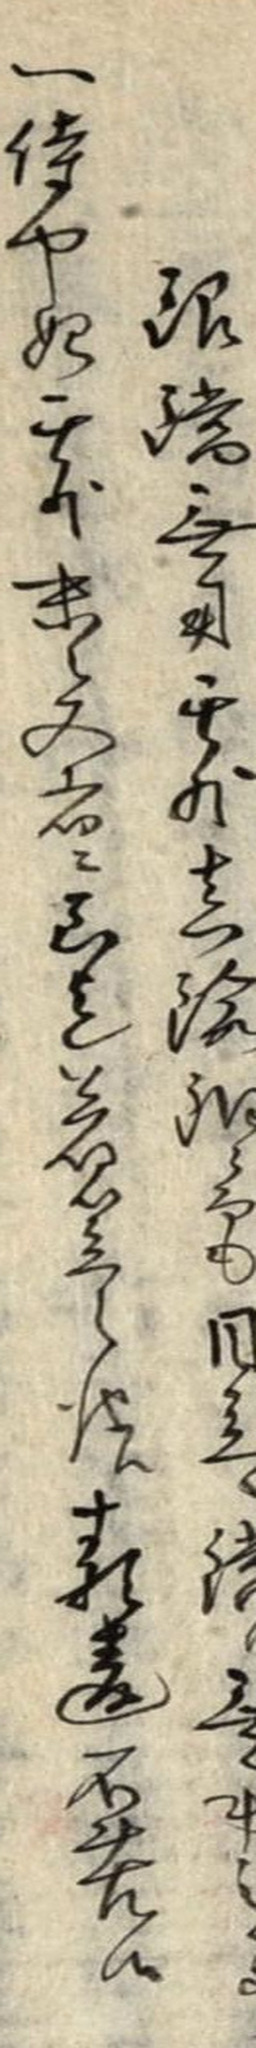一侍中始其外末々又者に至迄着笠之儀は類違不苦候
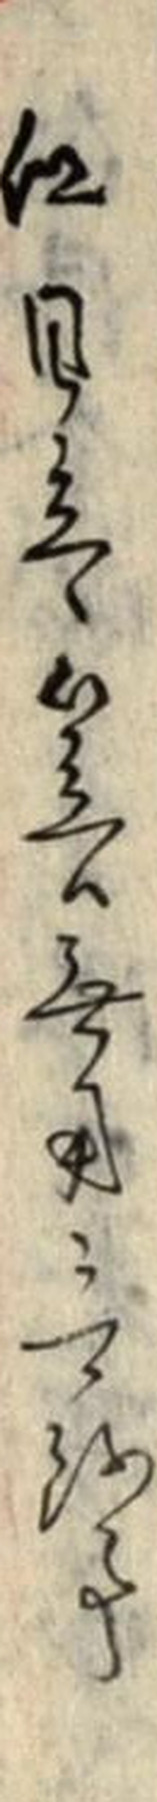但目立候笠は無用に可致事
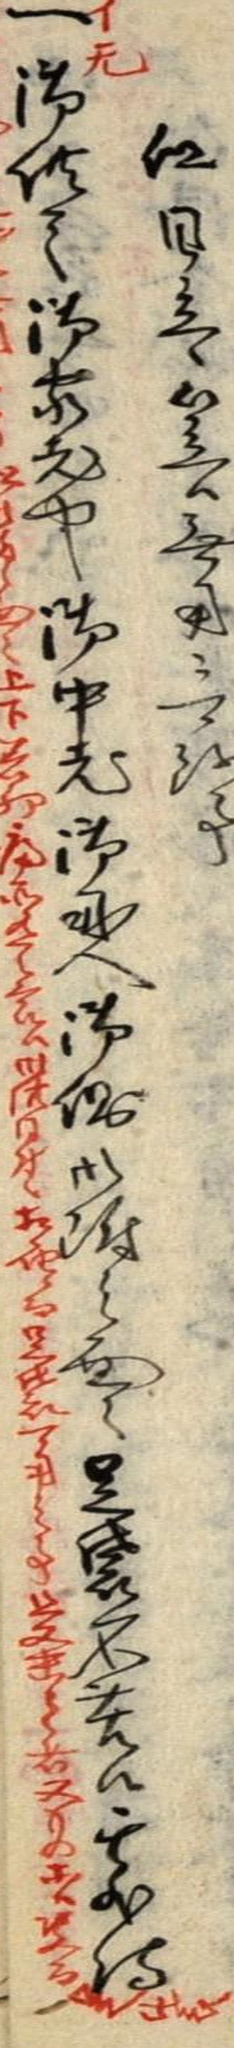一御供之御家老中御中老御用人御側御附之面々足袋不苦候其外侍

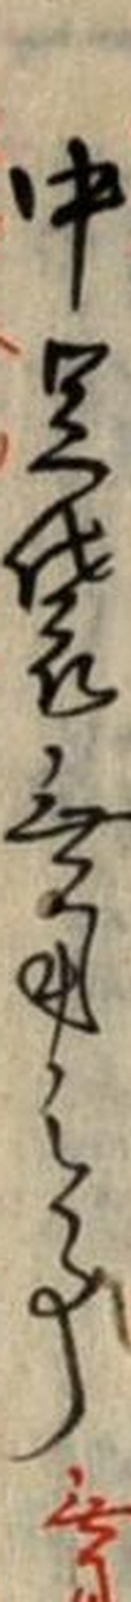中足袋無用之事
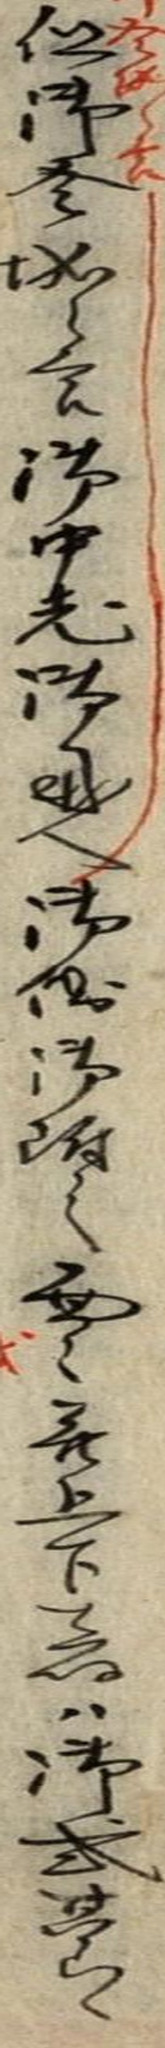但御登城之節御中老御用人御側御附之面々并上下着は御式台へ
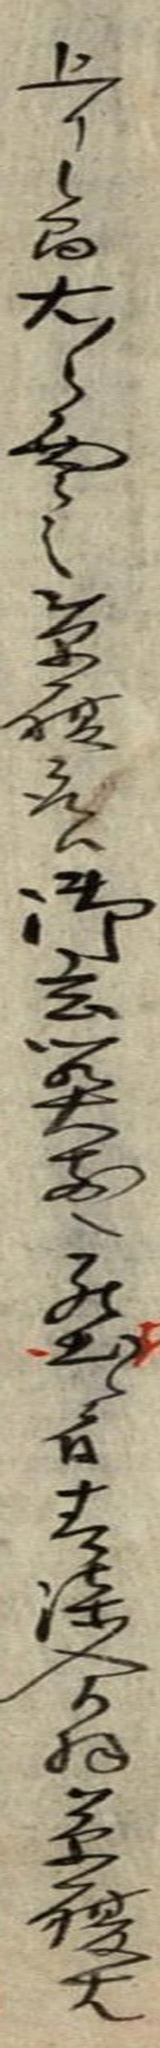上り候間右之面々之草履取は御玄関前へ罷越候に付青漆合羽草履は
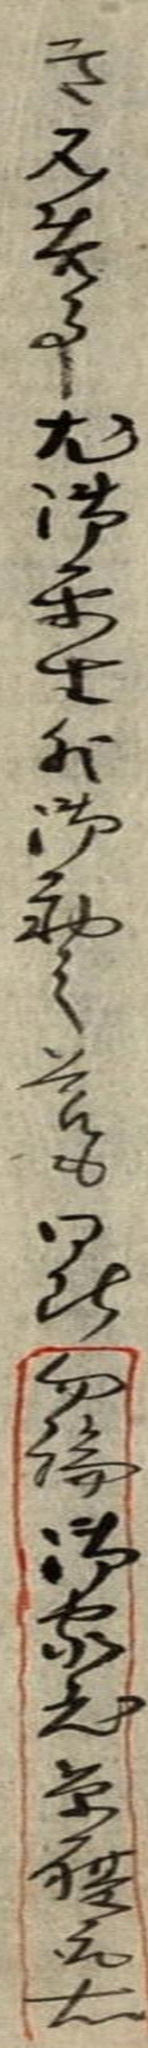き不苦事尤御平生外御勤之節も同断「勿論御家老草履取右
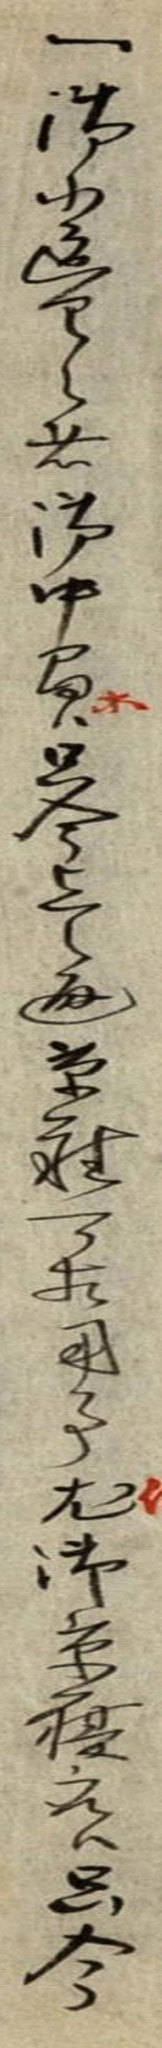一御小道具之者御中間等は只今迄之通草鞋可相用事尤御草履取は只今
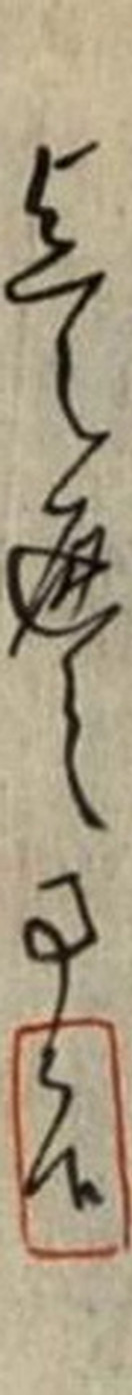迄之通之事
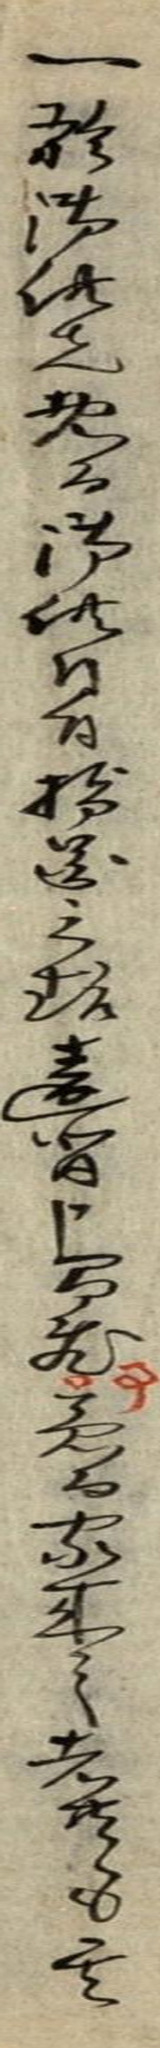一於御供先惣て御供目付指図之趣違背申間敷「事」兼て家来之者共へも其
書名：三都并道中之部
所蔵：福井県文書館 Fukui Prefectural Archives
